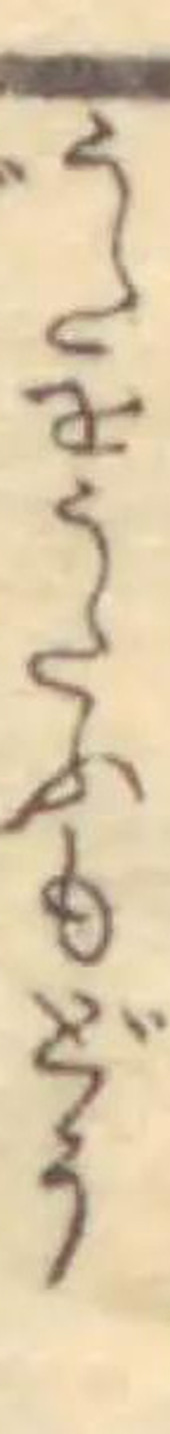うたをうたふもどう
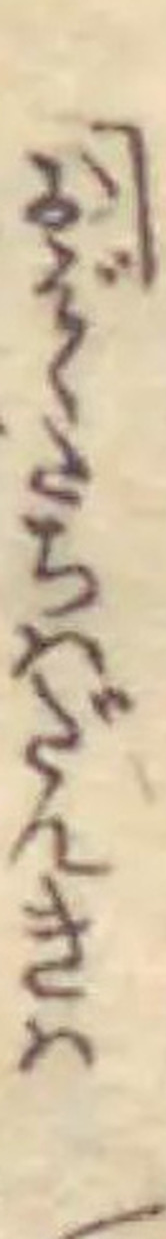乁おばゝたちはだんきは
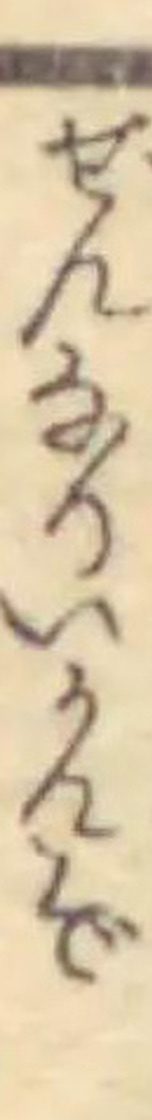ぜんなりいかんぞ
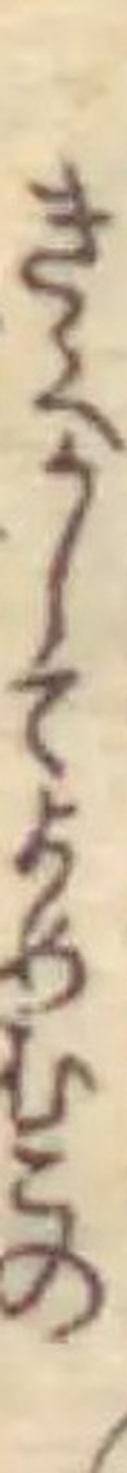きゝへかしてよめむこの
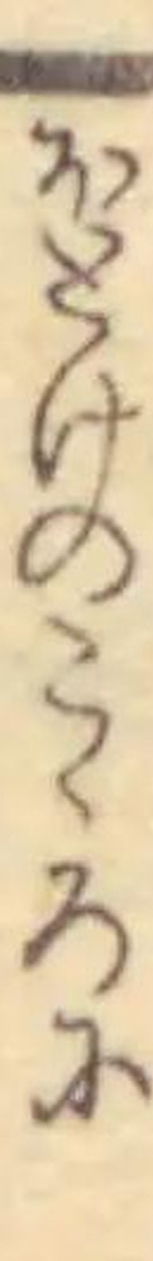ほとけのこゝろに
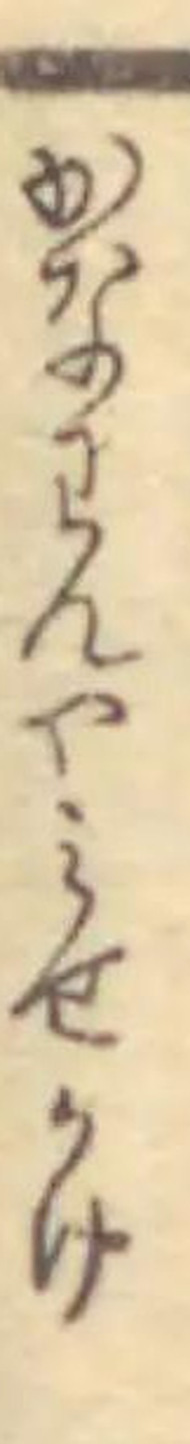かなわんやみせかけ
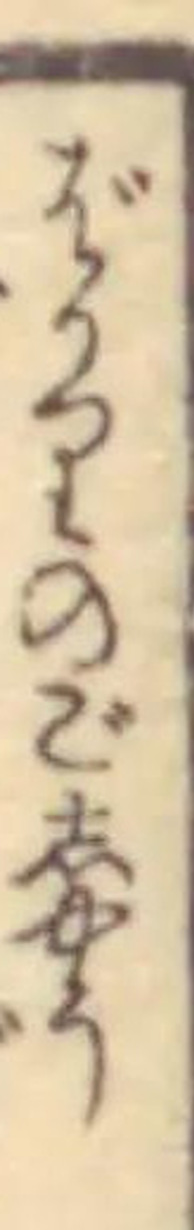ばかりのごしやう
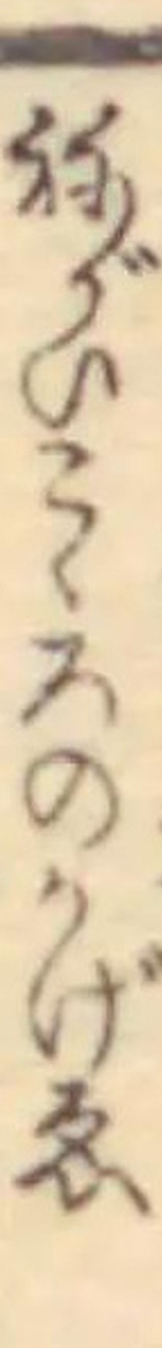ねがひこゝろのかげゑ
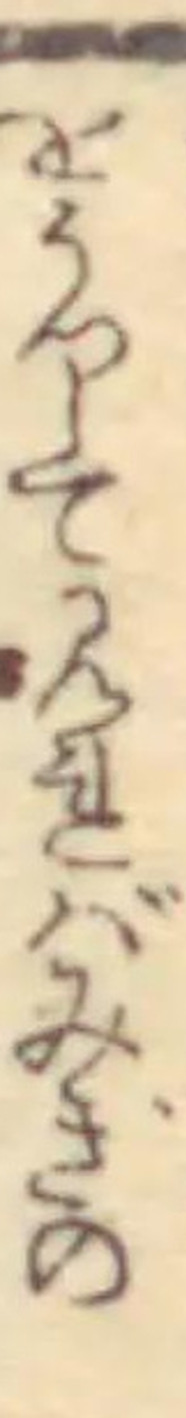をうつして見ればみぎの
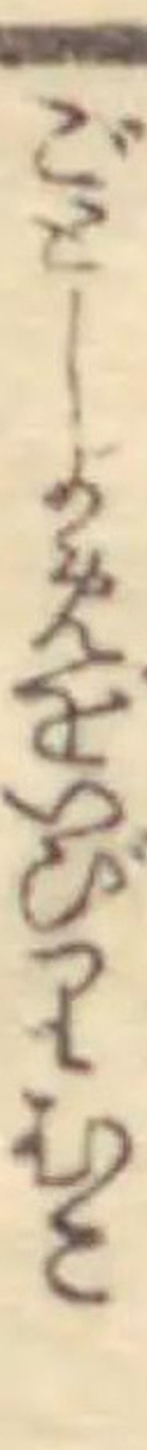ごとしよめをいびりむこ
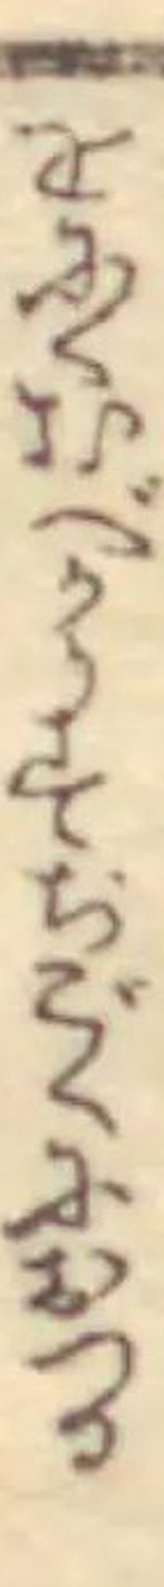にくむべからすぢごくにおつる
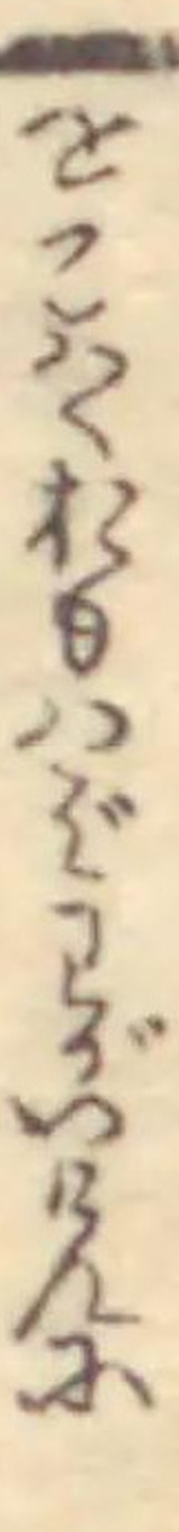をこはくおもはばわがいけんに
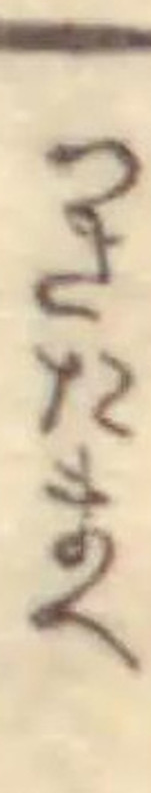つきたまへ
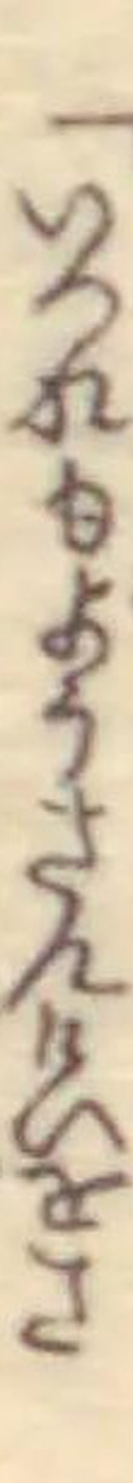乁いつれもようさんけいをさ
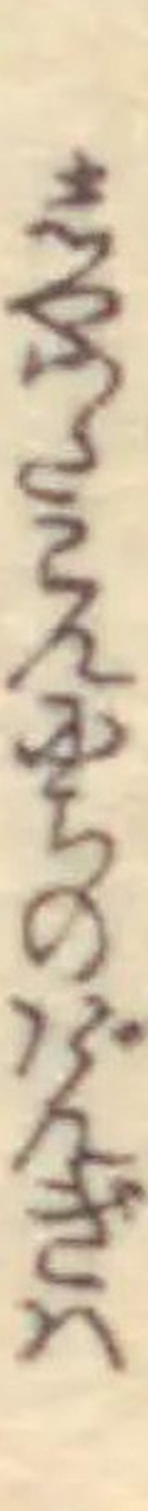しやつたこんにちのだんぎは
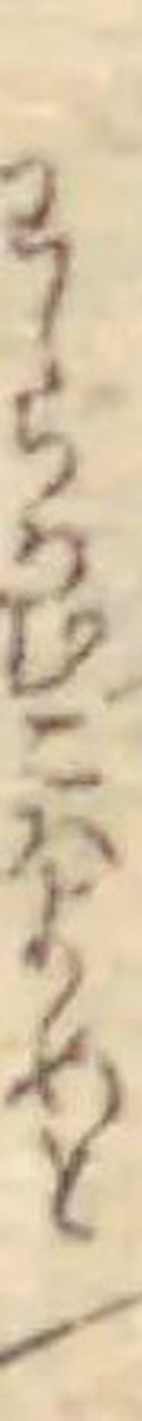わしらむこはよめと
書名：児訓影絵喩 3巻
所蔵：国立国会図書館 National Diet Library, JAPAN
